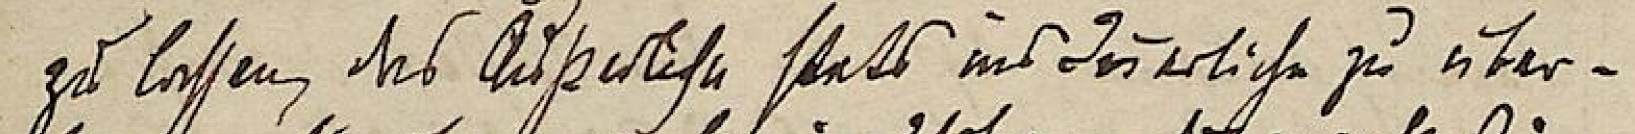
zu lassen, das Äußerliche stets ins Innerliche zu über¬
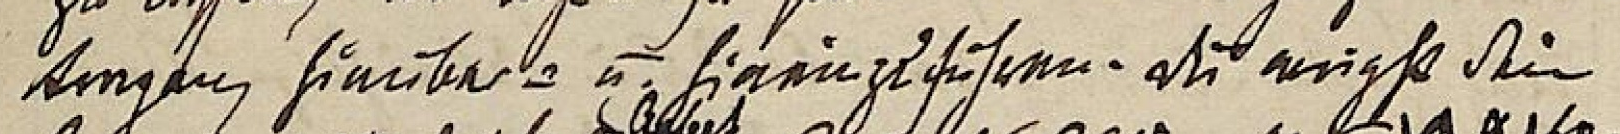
tragen, hinüber- u. hineinzuführen. Du neigst dein
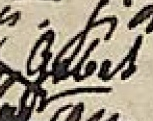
Gebet
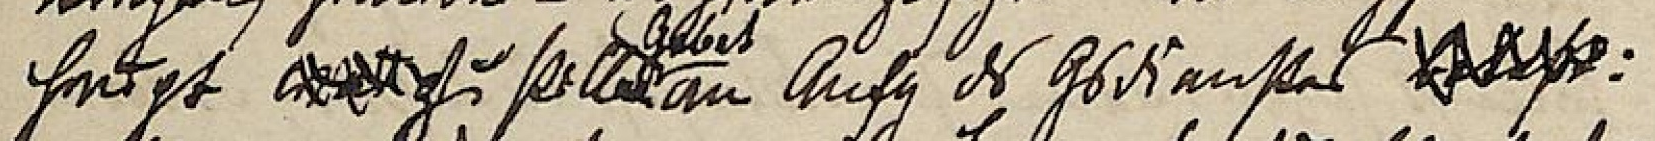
Haupt viell.bei stillem am Anfg ds Gsdienstes betest:
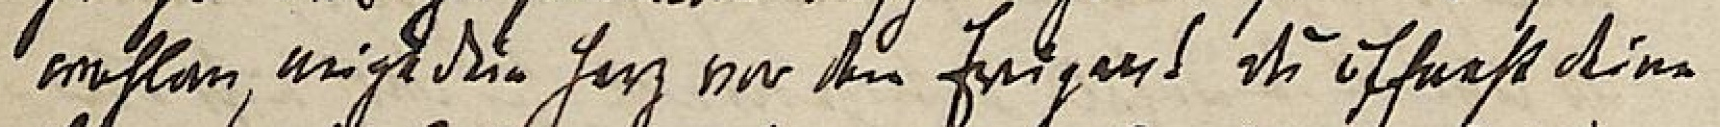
wohlan, neige dein Herz vor dem Ewigen! Du öffnest deine
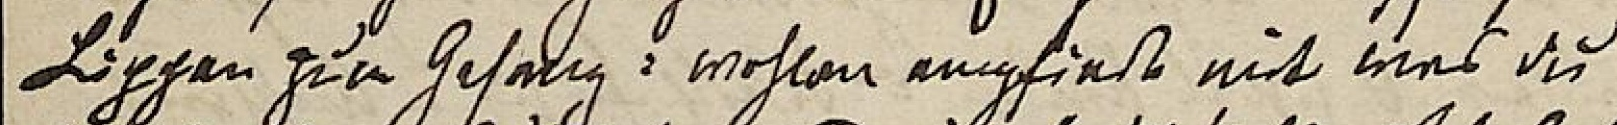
Lippen zum Gesang: wohlan empfinde mit was du
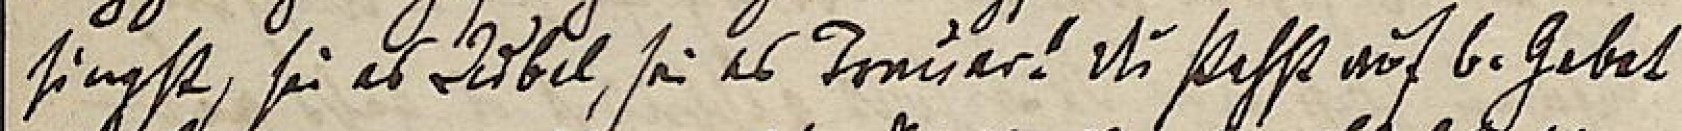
singst, sei es Jubel, sei es Trauer! Du stehst auf b. Gebet
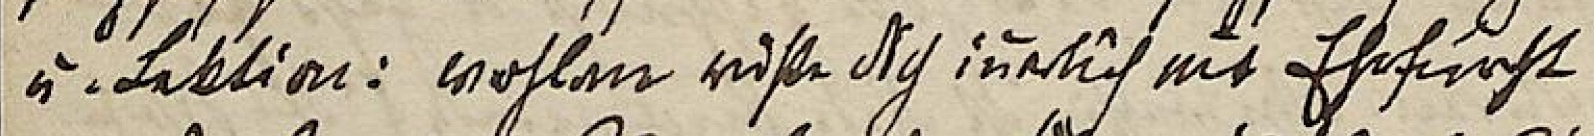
u. Lektion: wohlan richt dich inerlich mit Ehrfurcht
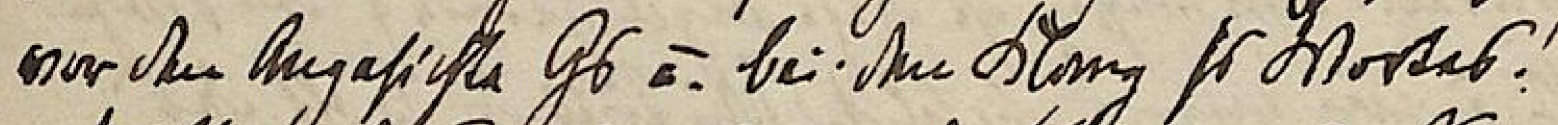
vor dem Angesichte Gs. u. bei dem Klang ss Wortes!
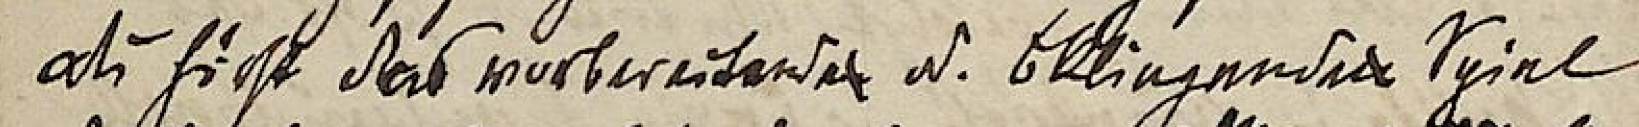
Du hörst das vorbereitende o. aklingenden Spiel
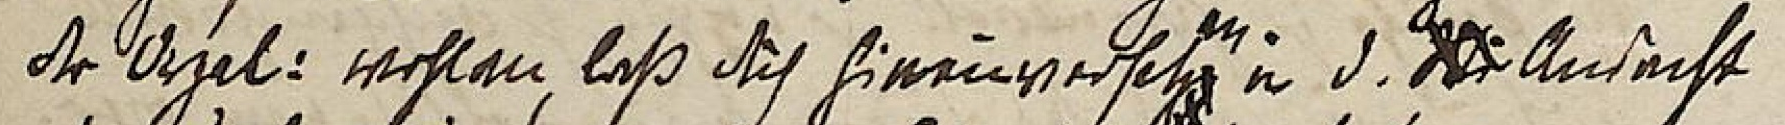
der Orgel: wohlann, laß dich hineinversetzen in d. Sti Andacht
